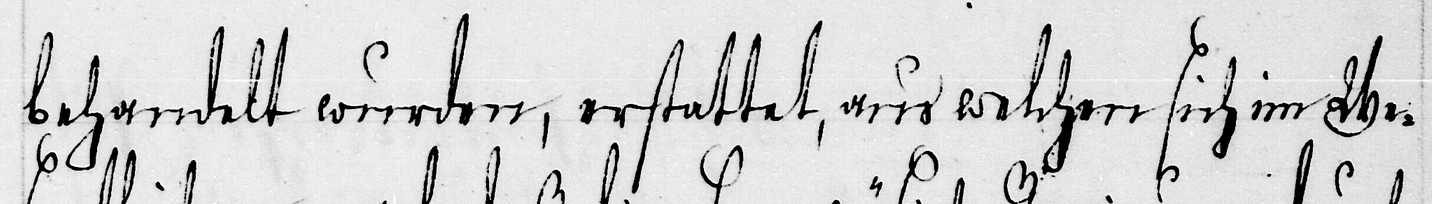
behandelt wurden, erstattet, aus welchen sich im We¬
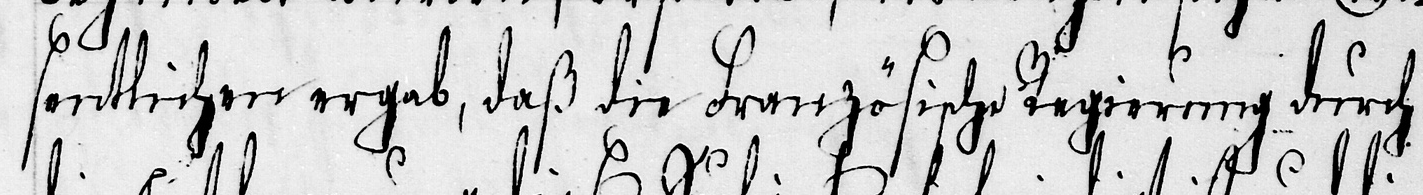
sentlichen ergab, daß die Französische Regierung durch
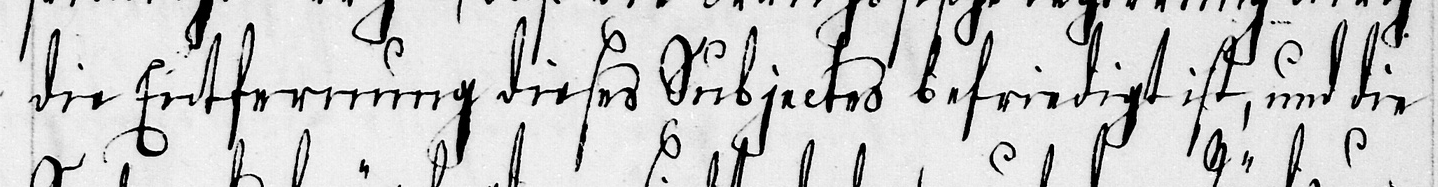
die Entfernung dieses Subjectes befriedigt ist, und die
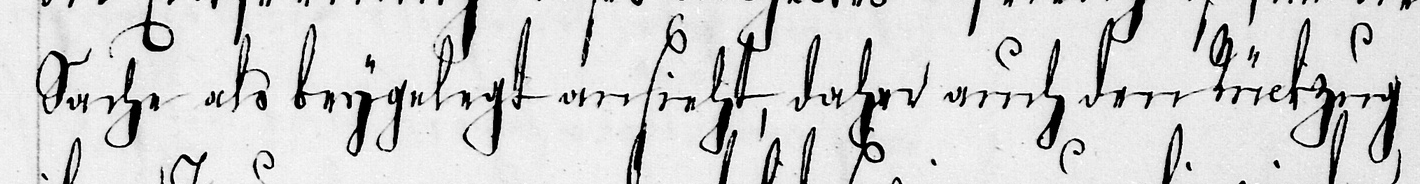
Sache als beygelegt ansieht, daher auch den Rückzug
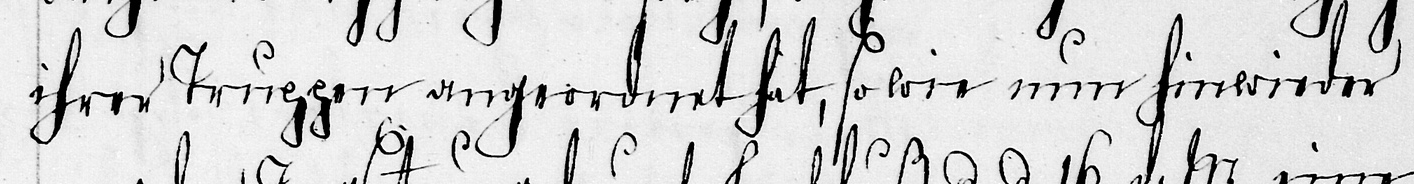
ihrer Truppen angeordnet hat, sowie nun hinwieder
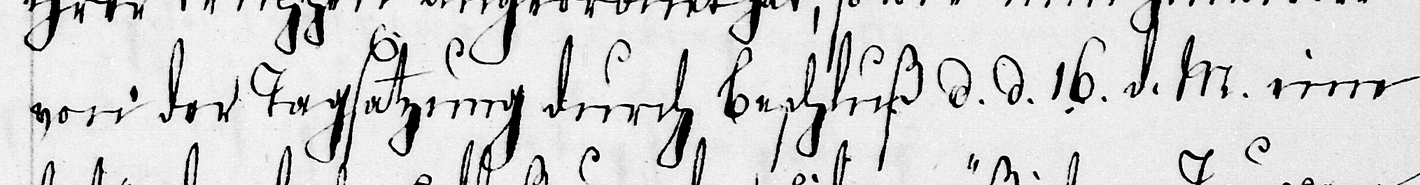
von der Tagsatzung durch Beschluß d. d. 16. d. M. eine
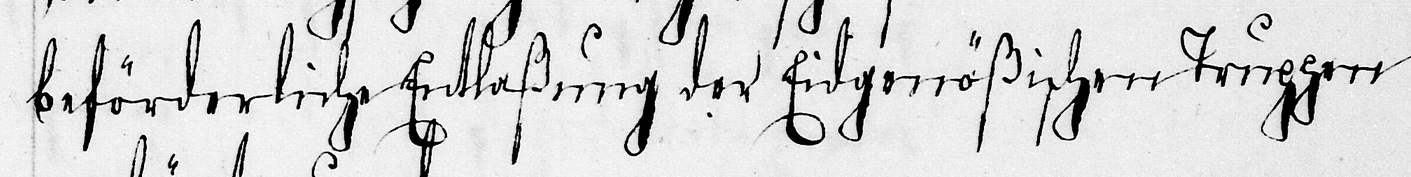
beförderliche Entlaßung der Eidgenößischen Truppen
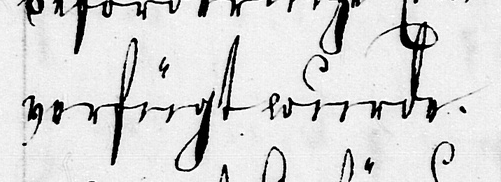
verfügt wurde.
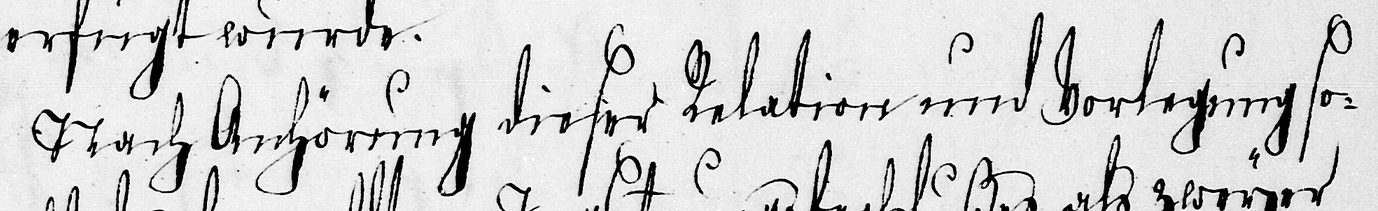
Nach Anhörung dieser Relation und Vorlegung so¬
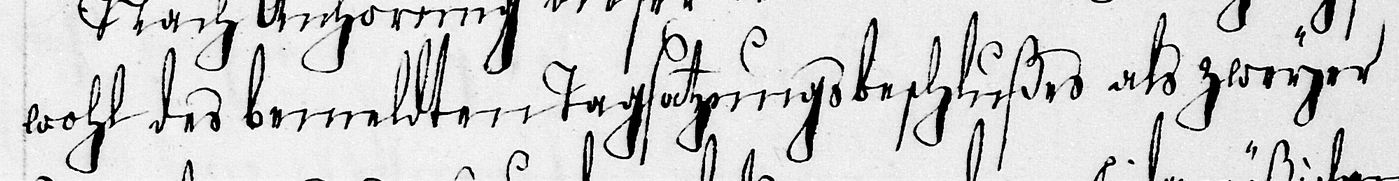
wohl des bemeldten Tagsatzungsbeschlußes als zweyer
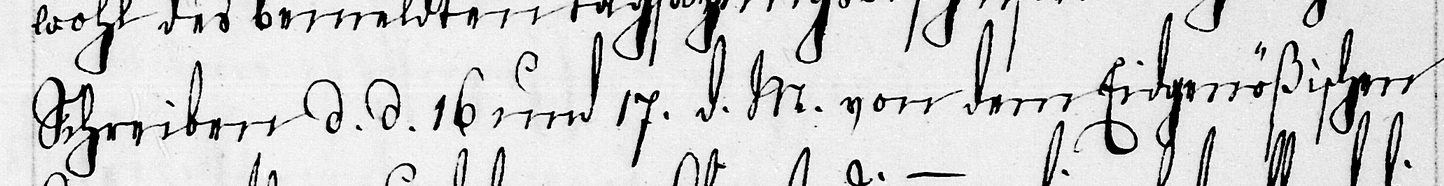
Schreiben d. d. 16 und 17. d. M. von dem Eidgenößischen
